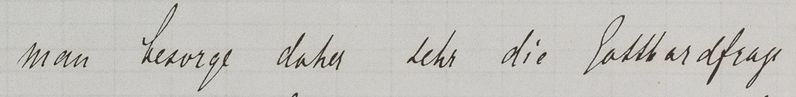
man besorge daher sehr die Gotthardfrage
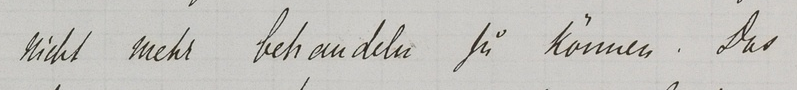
nicht mehr behandeln zu können. Das
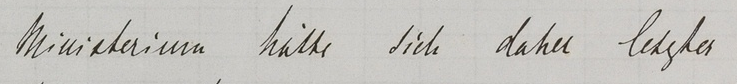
Ministerium hätte sich daher letzter
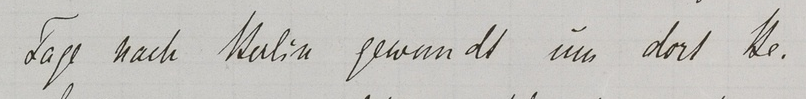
Tage nach Berlin gewandt um dort Be-
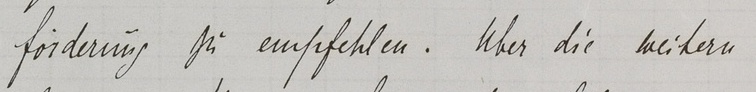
förderung zu empfehlen. Über die weitern
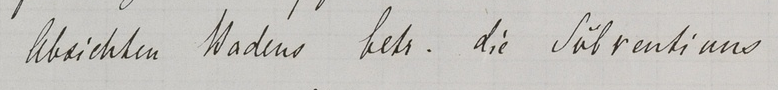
Absichten Badens betr. die Subventions-
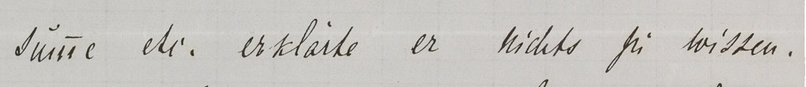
summe etc. erklärte er nichts zu wissen.
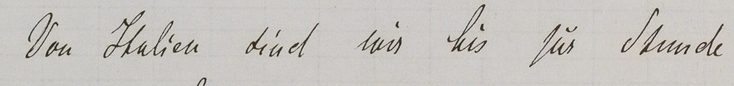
Von Italien sind wir bis zur Stunde
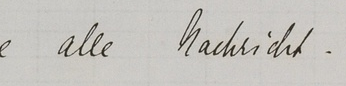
alle Nachricht.
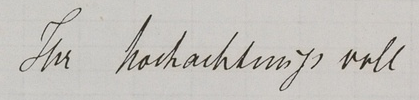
Ihr hochachtungsvoll
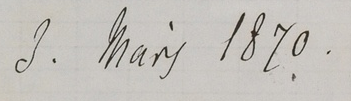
3. März 1870.
